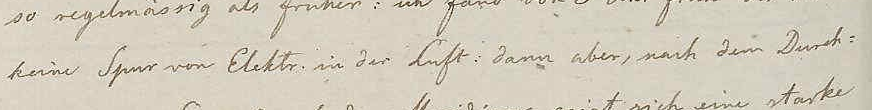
keine Spur von Elektr. in der Luft: dann aber, nach dem Durch-
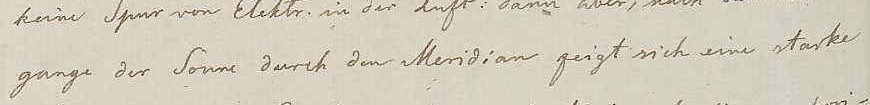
gange der Sonne durch den Meridian zeigt sich eine starke
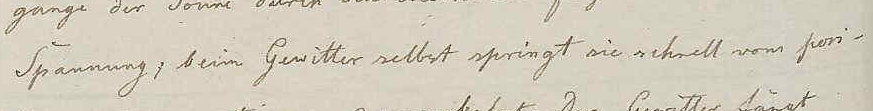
Spannung; beim Gewitter selbst springt sie schnell vom posi-
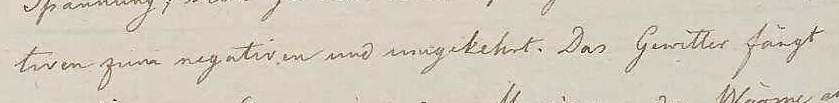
tiven zum negativen und umgekehrt. Das Gewitter fängt
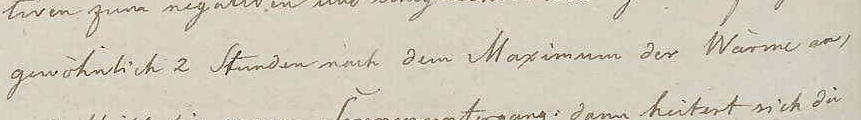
gewöhnlich 2 Stunden nach dem Maximum der Wärme an,
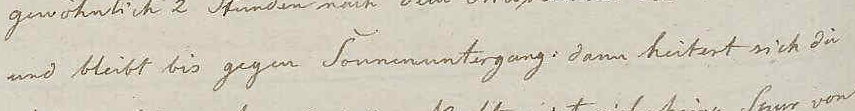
und bleibt bis gegen Sonnenuntergang: dann heitert sich die
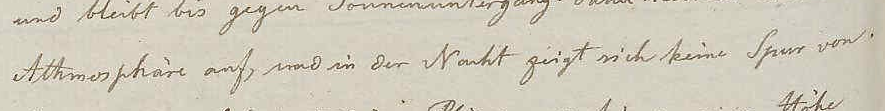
Athmosphäre auf, und in der Nacht zeigt sich keine Spur von
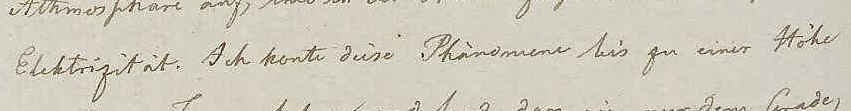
Elektrizität. Ich konte diese Phänomene bis zu einer Höhe
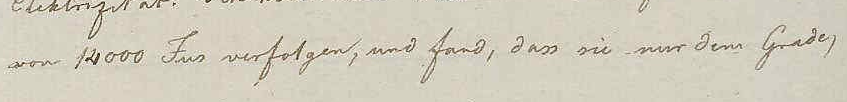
von 14000 Fus verfolgen, und fand, dass sie nur dem Grade,
